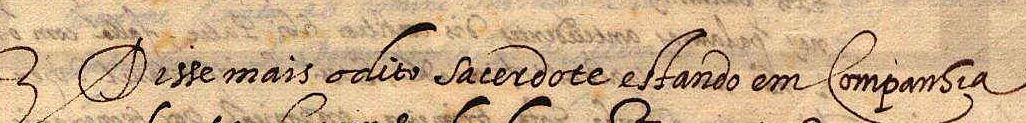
3 Disse mais o dito sacerdote estando em Companhia
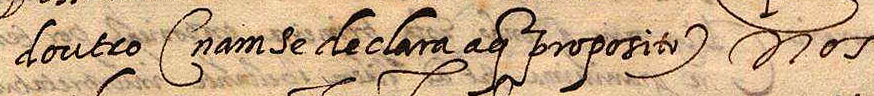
doutro (nam se declara a q̄ proposito) Nos
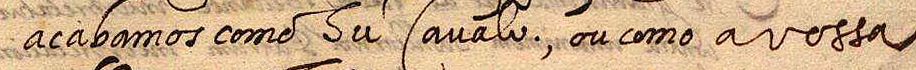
acabamos como hū Caualo; ou como a vossa
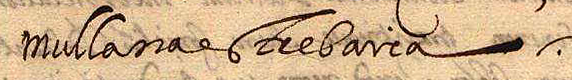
mulla na estrebaria /.
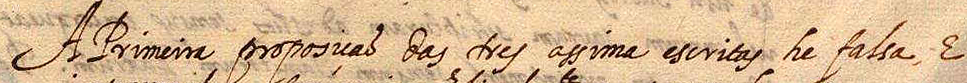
A Primeira proposiçaõ das tres assima escritas he falsa, E
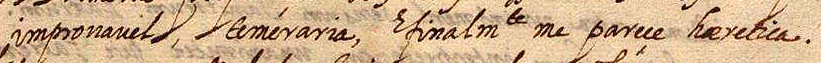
improuauel, temeraria, E finalmte me parece hæretica.
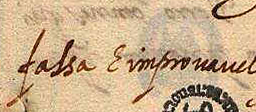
falsa E improuauel
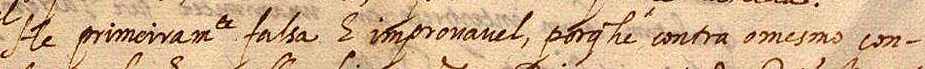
He primeiramte falsa E improuauel, porq̄ he contra o mesmo con
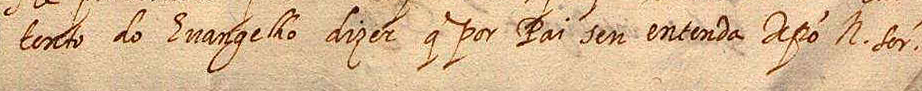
texto do Euangelho dizer q̄ por Pai seu entenda Xpō N. Sor̄.
